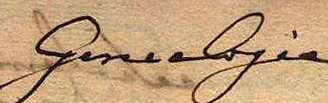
Genealogia
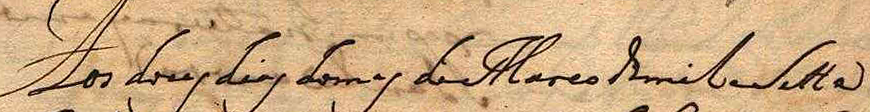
Aos dous dias do mes de Marco de mil Sette
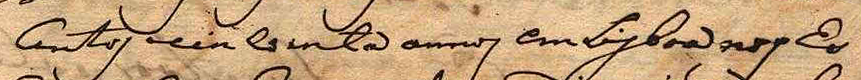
Centos e cincoenta annos em Lisboa nos Es
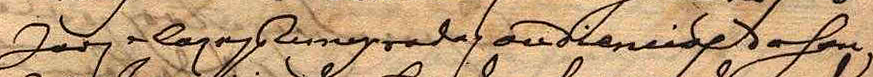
taos e Caza pRimeyra das audiencias da san
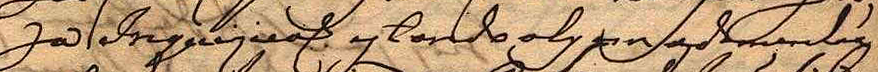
ta Inquiziçaõ estando ahy em a de manhaã
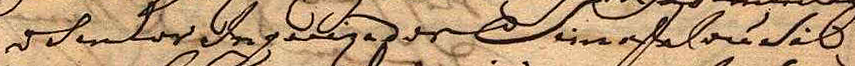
o Senhor Inquizidor Simaõ Iozé Sil
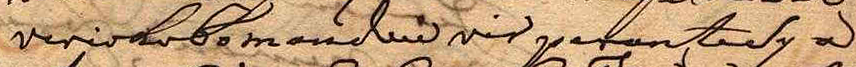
verio Lobo mandou vir perante sy a
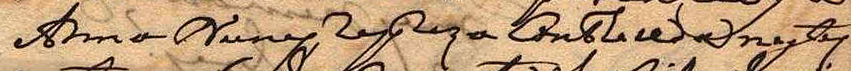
Anna Nunes, Re pReza Contheuda nestes
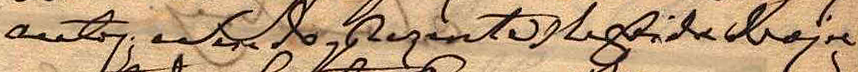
autos; e sendo pRezente lhe foi dado ju
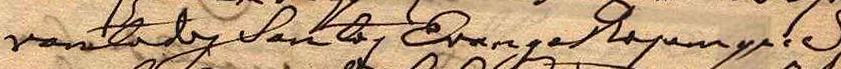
ramento dos Santos Evangelhos em que
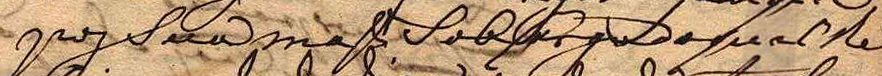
pos Sua maõ Sob Cargo do qual lhe
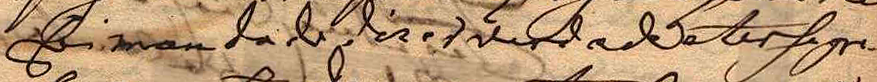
foi mandado dizer verdade e ter segre
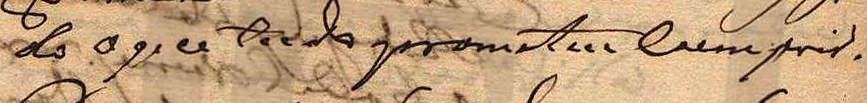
do o que tudo prometeu Cumprir.
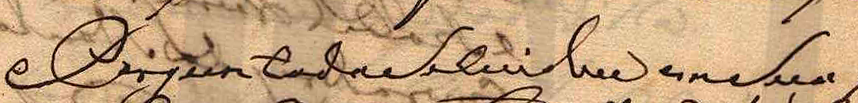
e Perguntado Se Cuidou em Suas
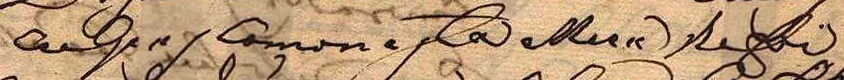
culpas Como nesta Meza lhe foi
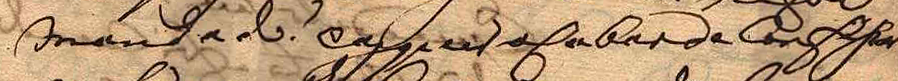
mandado; e as quer aCabar de confessar
